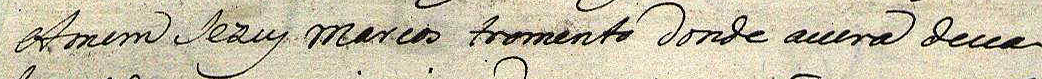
Amem Iesus marcos tromenta donde auera deua
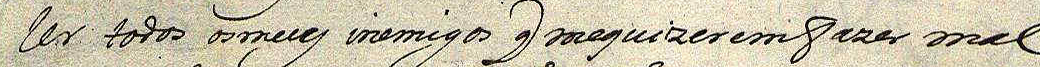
ler todos os meus inemigos q̄ me quizerem fazer mal
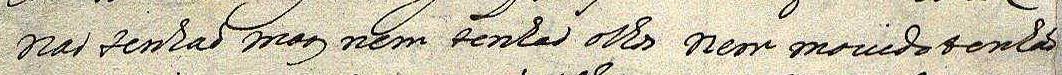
naõ tenhaõ maos nem tenhaõ olhos nem mouido tenhaõ
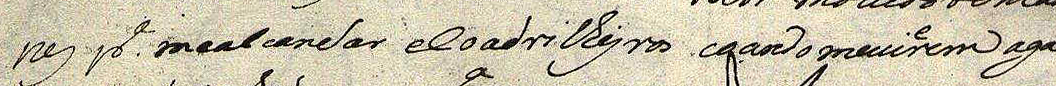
pes p.a me alcansar e coadrilhejros coando meueirem aga
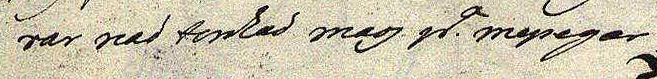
rar naõ tenhaõ maos p.a me pegar
